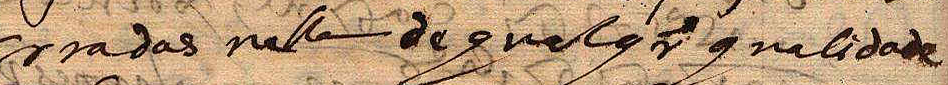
Erradas nella de qualqr̄ qualidade
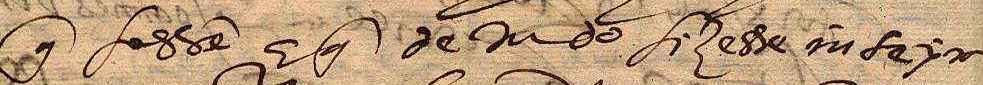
q̄ fossē E q̄ de tudo fizesse inteyra
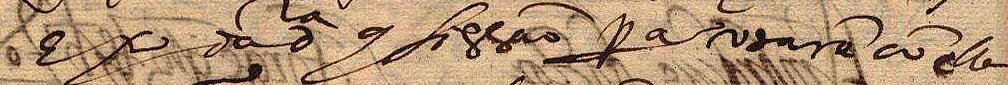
E ꝟdadra ꝯfissaõ ꝑa vsarē cō ella
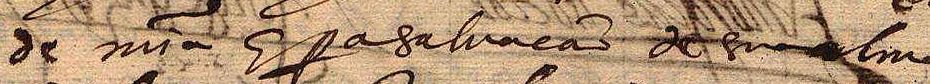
de mīa E ꝑa saluacaõ de sua alma
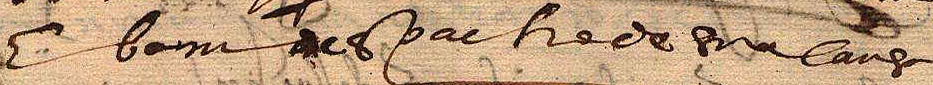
E bom despacho de sua causa
